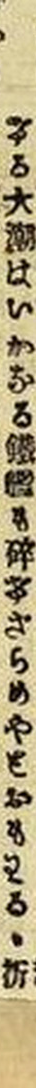ける大潮はいかなる鐵艦も碎けざらめやとおもわるゝ折
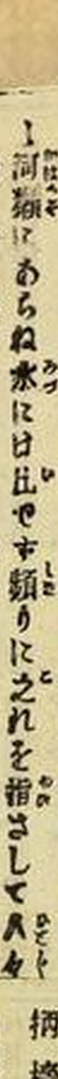ゝ河獺にあらね水には出でず頻りに之れを指さして人々
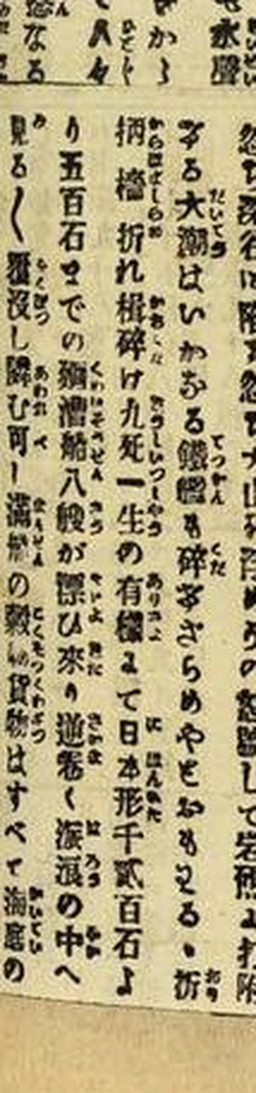柄檣折れ楫碎け九死一生の有樣にて日本形千貮百石よ
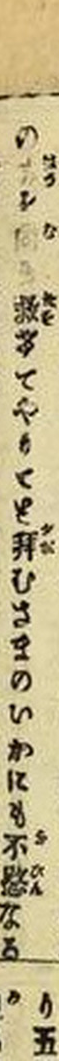の方を向き救けてやりてと拜むさまのいかにも不愍なる
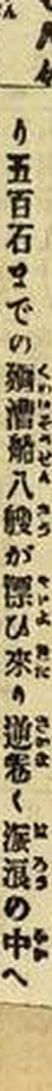り五百石までの廻漕船八艘が漂ひ來り逆巻く波浪の中へ
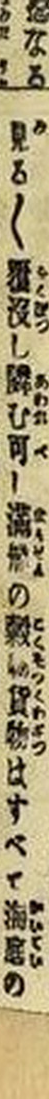見る〳〵覆沒し憐む可し滿舩の穀物貨物はすべて海底の
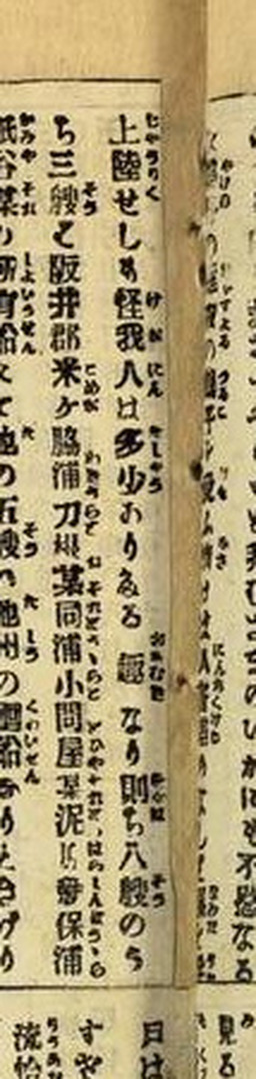上陸せしも怪我人は多少ありたる趣なり則ち八艘のう
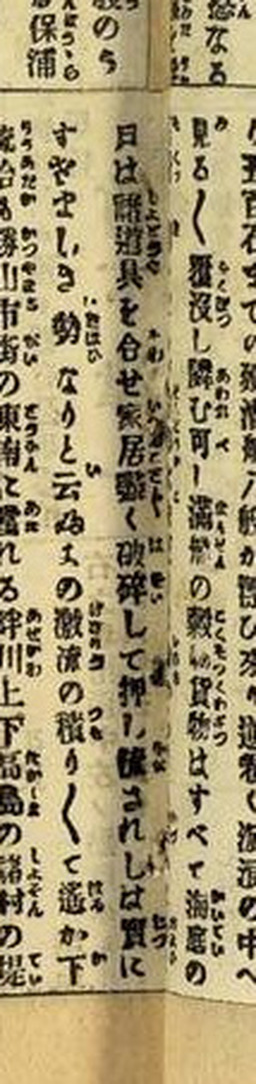戸は諸道具を合せ家居盡く破碎して押し流されしは實に
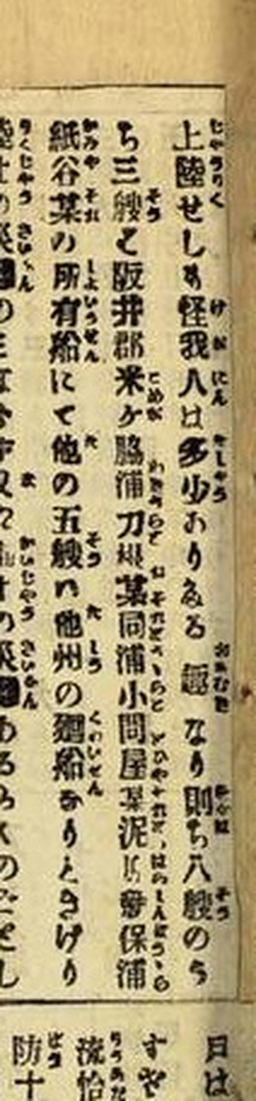ち三艘は阪井郡米ヶ脇浦刀根其同浦小問屋其泥原新保浦
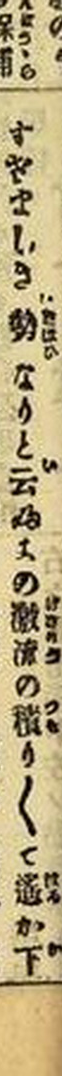すざまじき勢なりと云ふこの激流の積り〳〵て遙か下
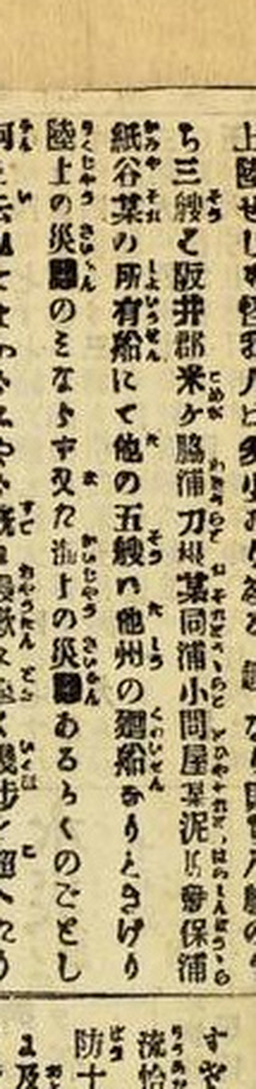紙谷某の所有船にて他の五艘は他州の廻船なりときけり
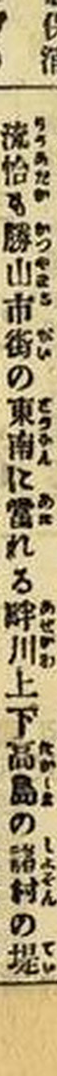流恰も勝山市街の東南に當れる畔川上下高島の諸村の堤
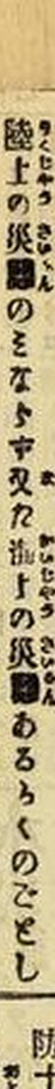陸上の災難のみならず又た海上の災難あるかくのごとし
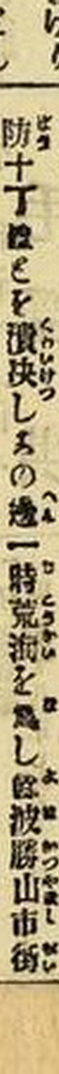防十丁ほとを潰決しこの邊一時荒海を爲し餘波勝山市街
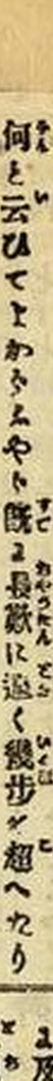何と云ひてよからふやら旣に長歎に遠く幾歩を超へたり
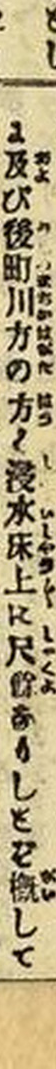に及び後町川方の方は浸水床上に尺餘なりしとぞ概して
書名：温古集 五巻
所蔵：福井県文書館 Fukui Prefectural Archives
